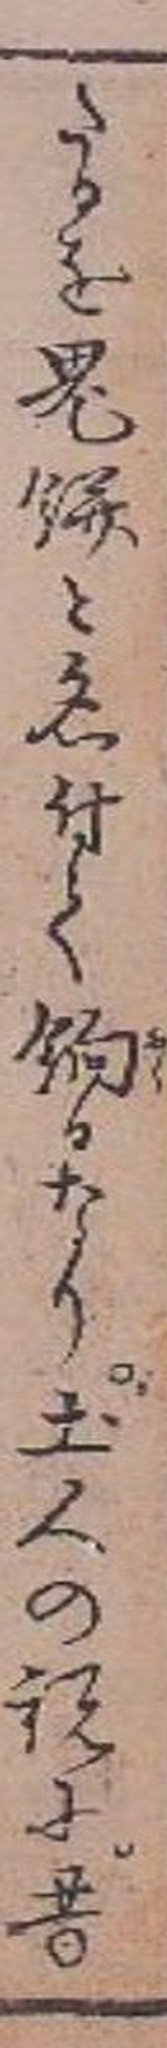たるを鬼餅と名付て餉るなり、土人の説に、昔
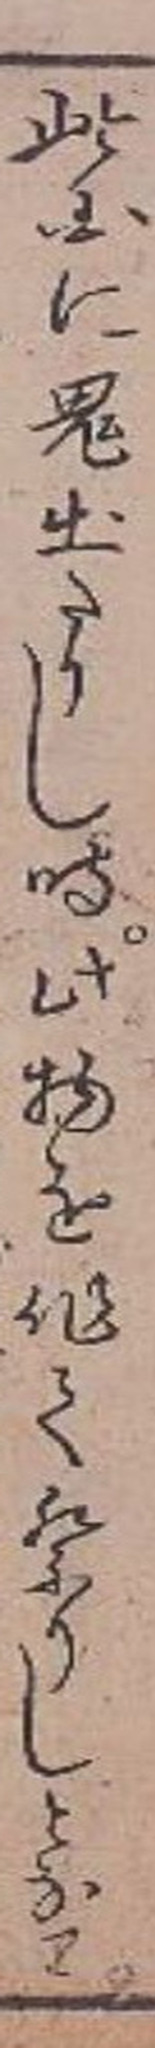此国に鬼出たりし時、此物を作て祭りしとなり、
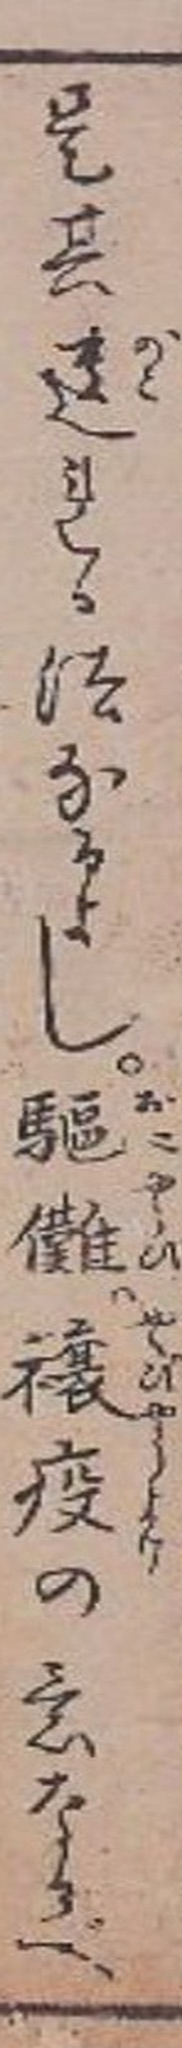是其遺れる法なるよし、駆儺。禳疫の意なるべ
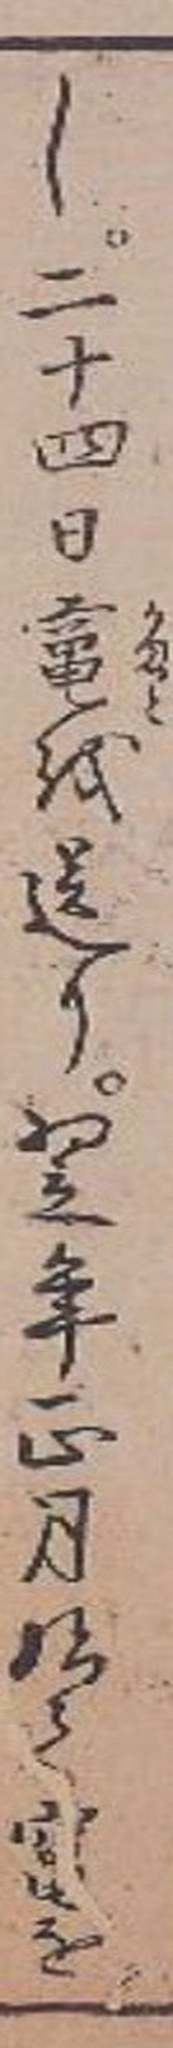し、二十四日竈を送り、翌年正月始て竈を
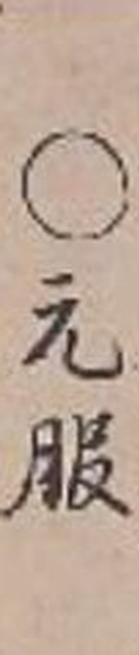○元服
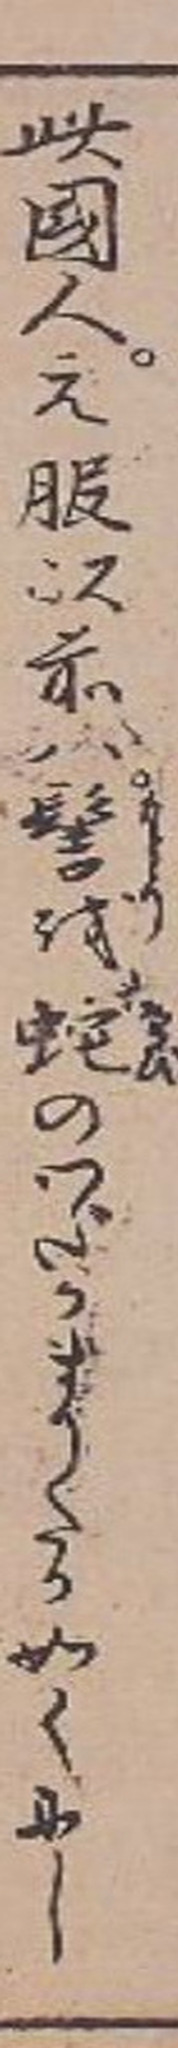此国人。元服以前は、髻を蛇のわだかまりたる如くにし
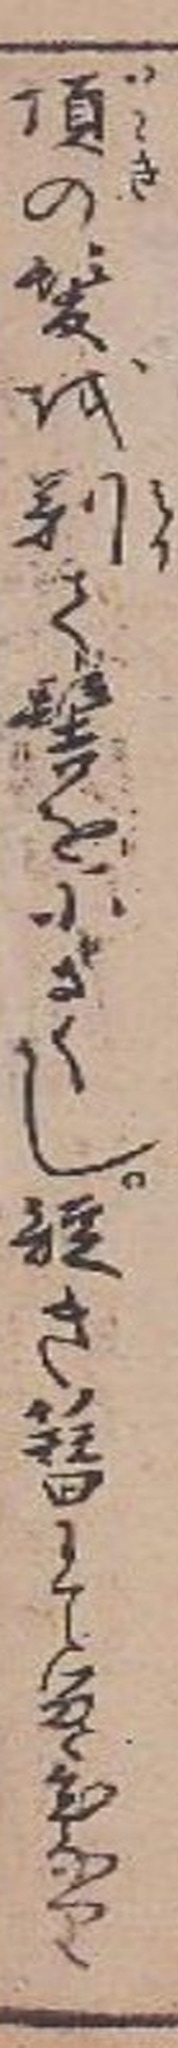頂の髪を剃て髻を小さくし、短き簪にて留置なり
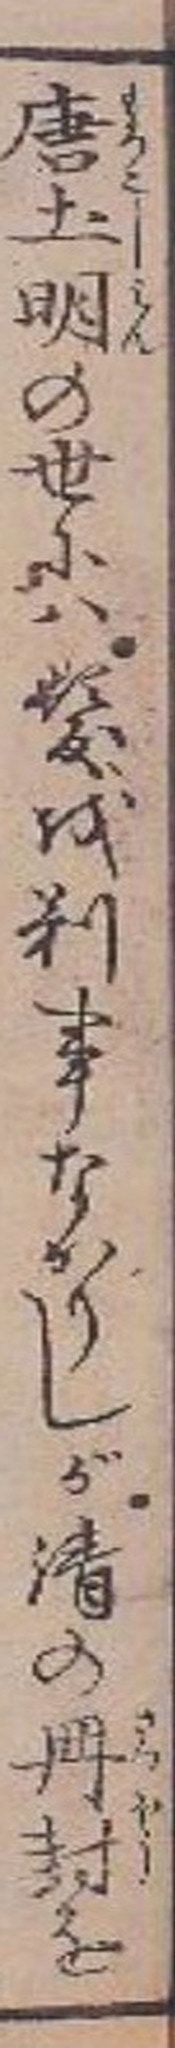唐土明の世には、髪を剃事なかりしが、清の冊封を
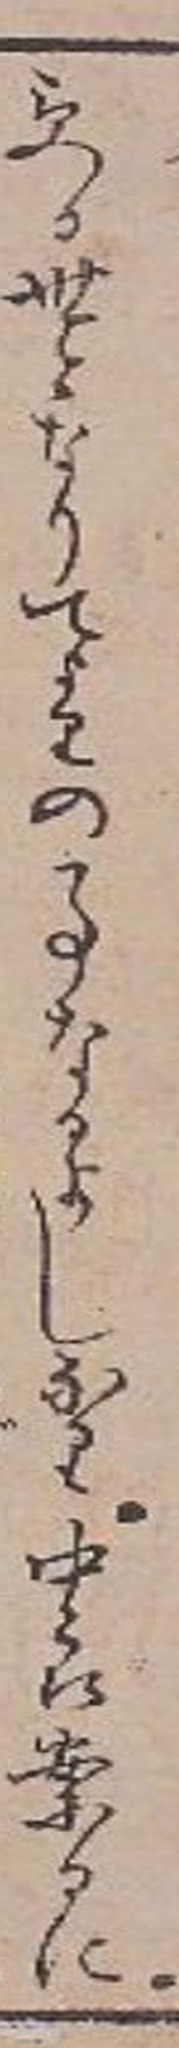受る世となりてよりの事なるよしなり、中良案るに、
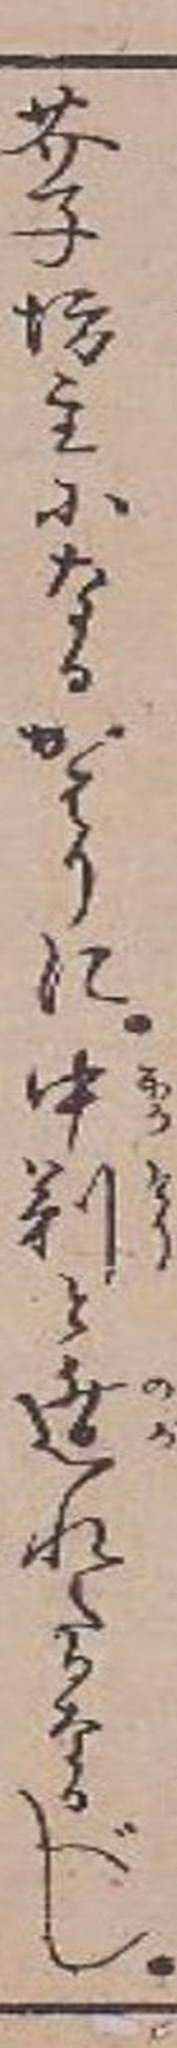芥子坊主になるかはりに、中剃と遁れたるなるべし、
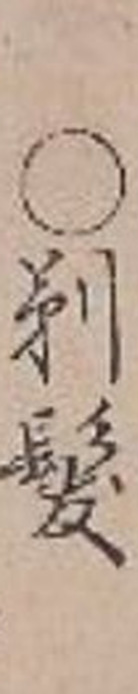○剃髪
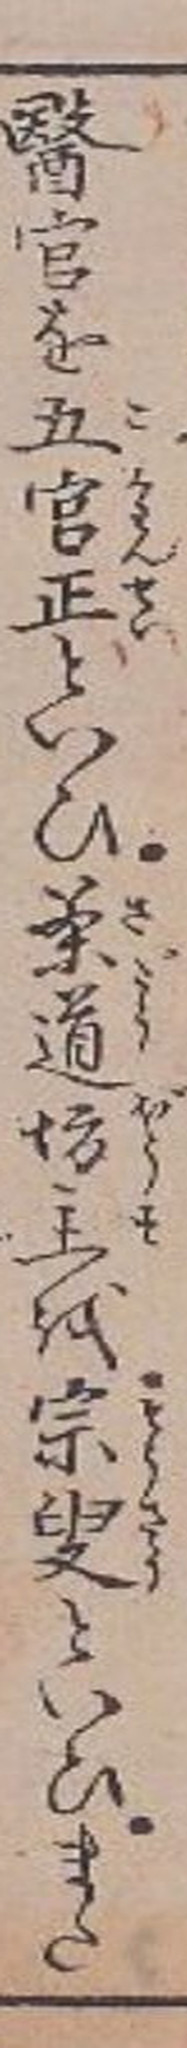医官を五官正といひ、茶道坊主を、宗叟といひ、また
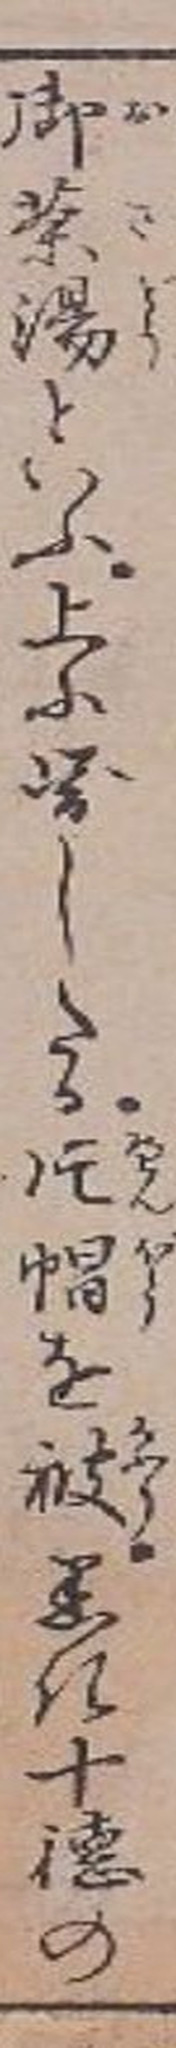御茶湯といふ、上に図したる、片帽を被、黒き十徳の
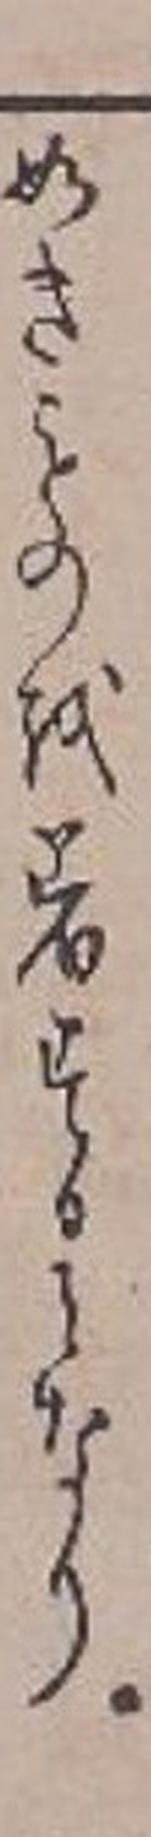如きものを着するとなり、
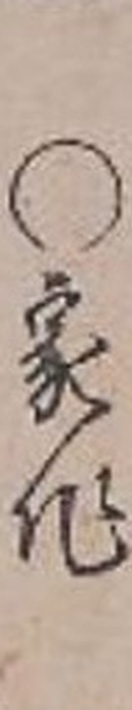○家作
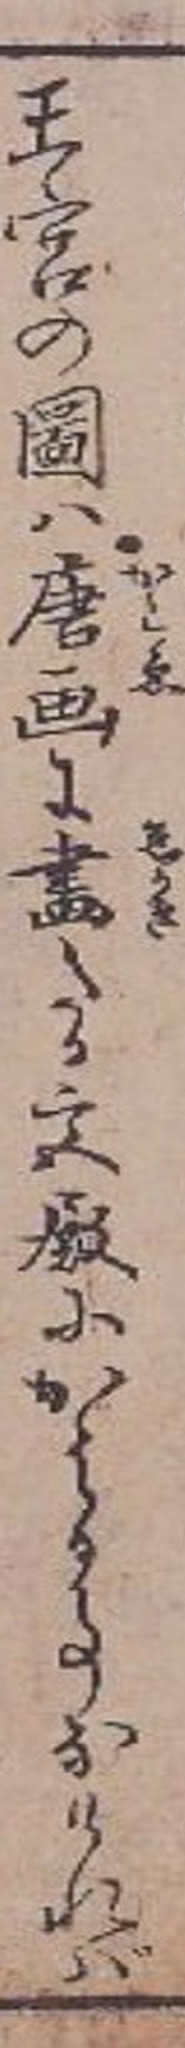王宮の図は、唐画に画たる宮殿にかはる事なければ
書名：琉球談
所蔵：University of the Ryukyus Library
